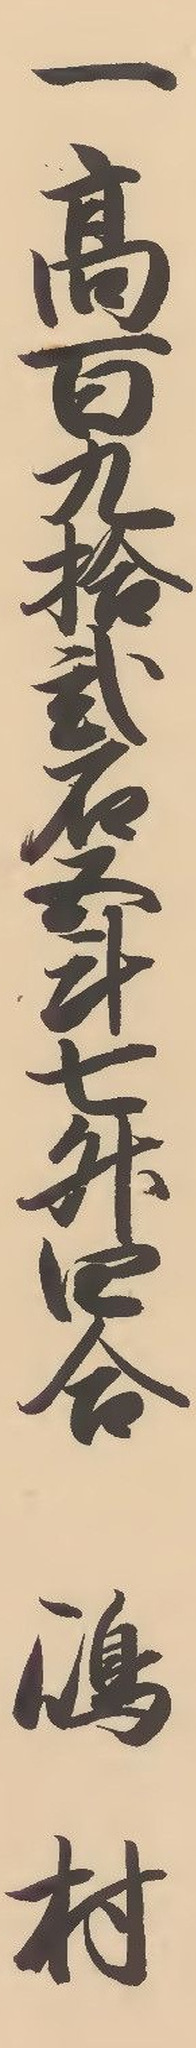一高百九拾弐石五斗七升四合島村

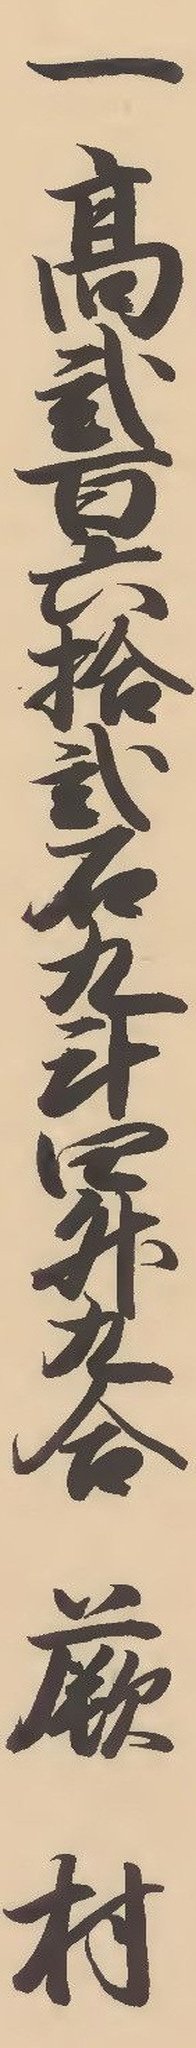一高弐百六拾弐石九斗四升九合蕨村
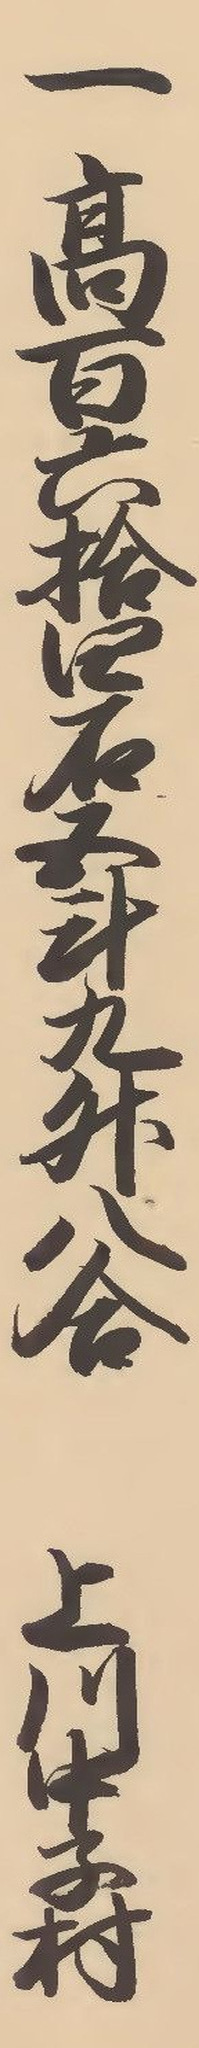一高百六拾四石五斗九升八合上川中子村
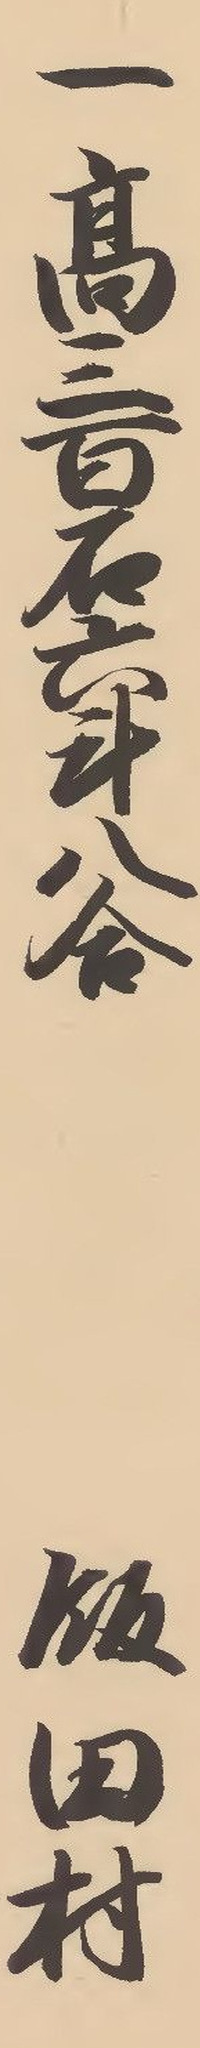一高三百石六斗八合飯田村
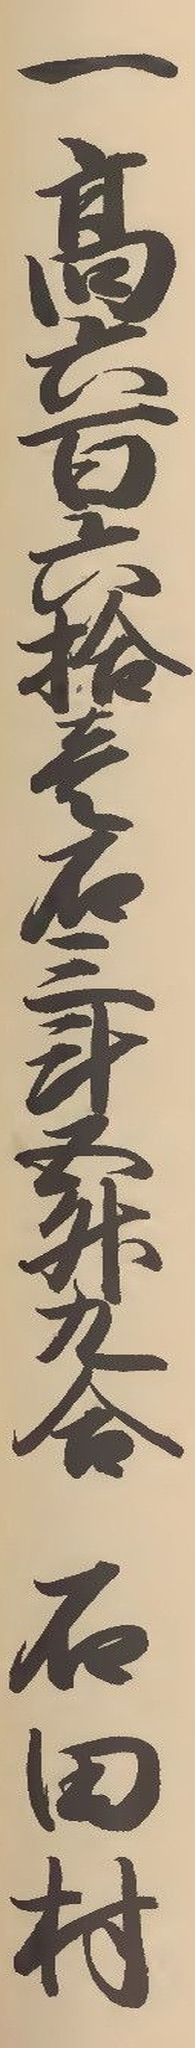一高六百六拾壱石三斗五升九合石田村
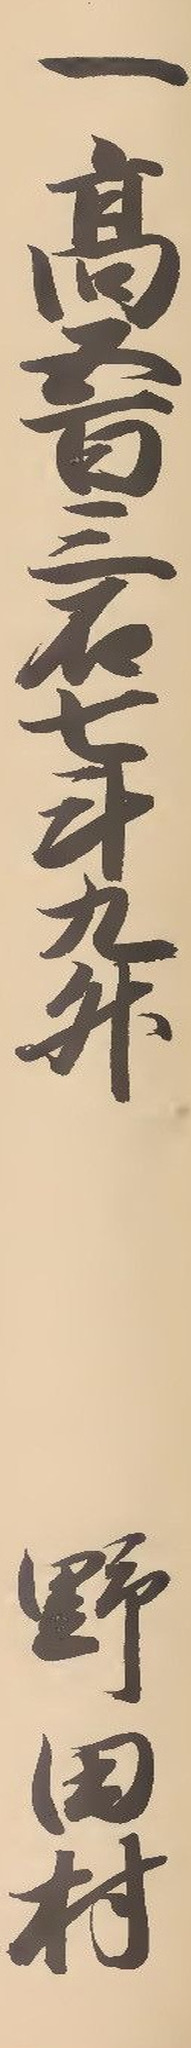一高五百三石七斗九升野田村
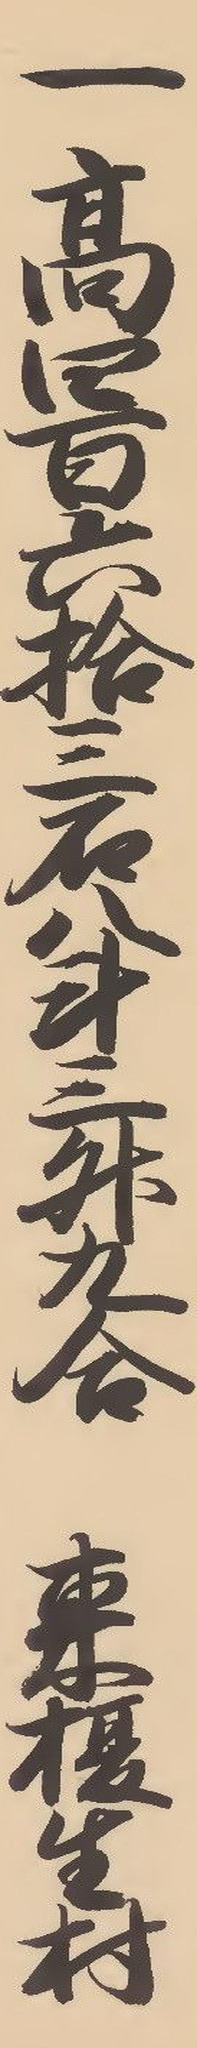一高四百六拾三石八斗三升九合東榎生村
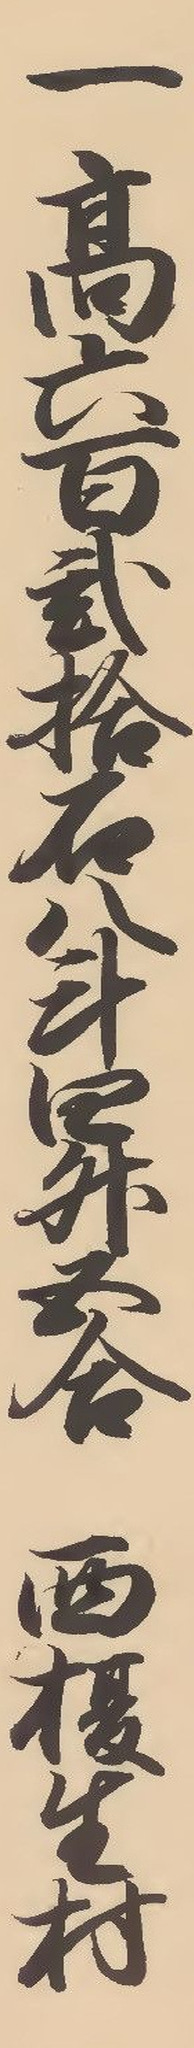一高六百弐拾石八斗四升五合西榎生村
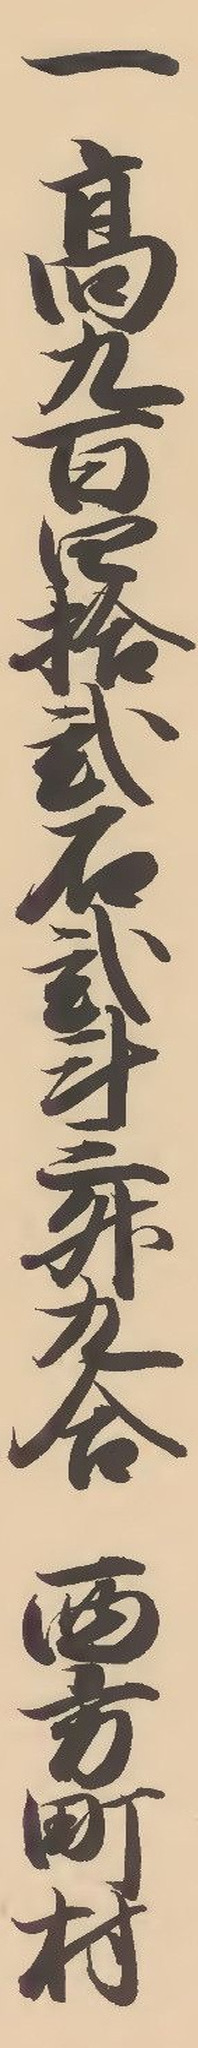一高九百四拾弐石弐斗三升九合西方町村

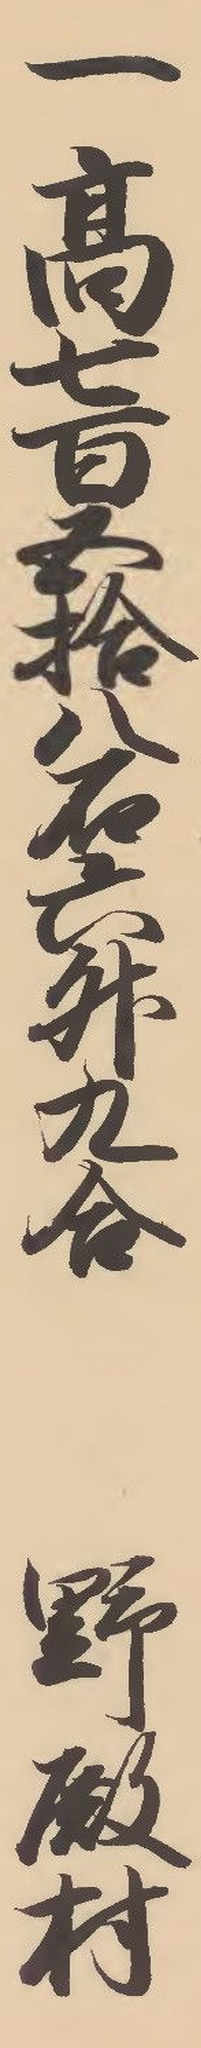一高七百五拾八石六升九合野殿村
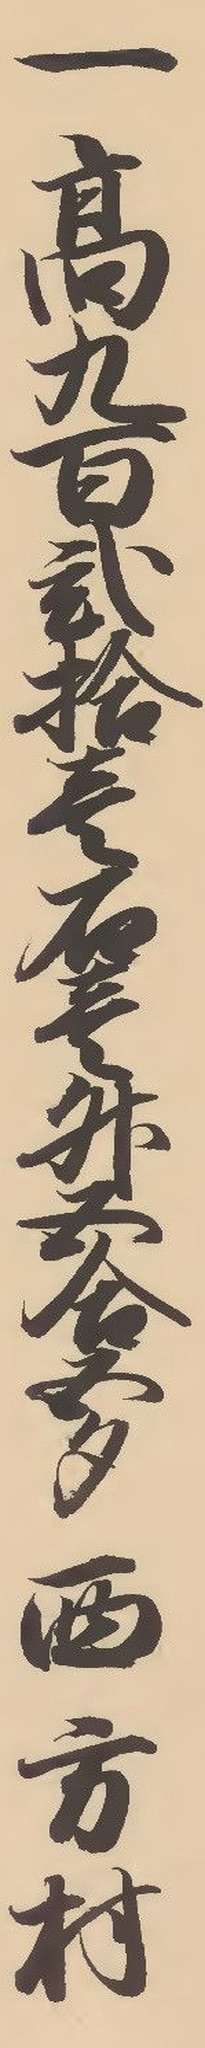一高九百弐拾壱石壱升五合五勺西方村
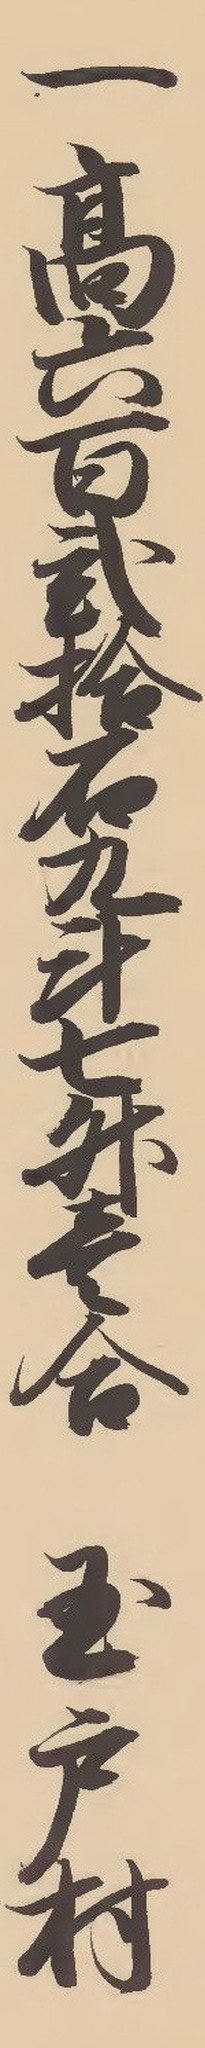一高六百弐拾石九斗七升壱合玉戸村
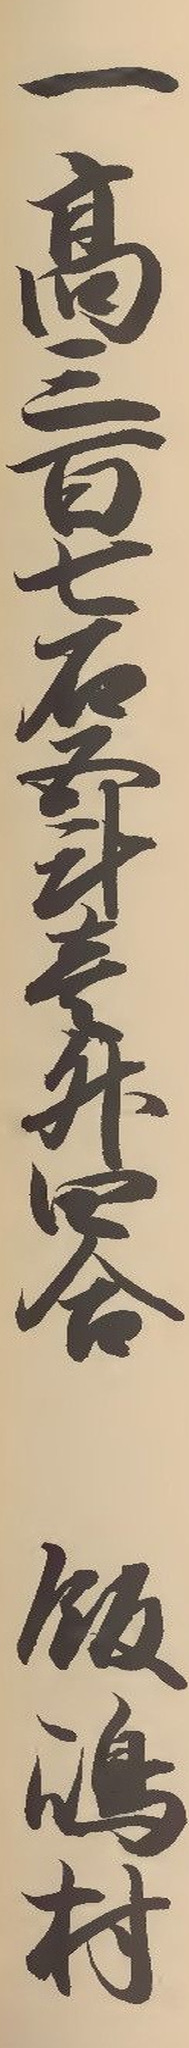一高三百七石五斗壱升四合飯島村
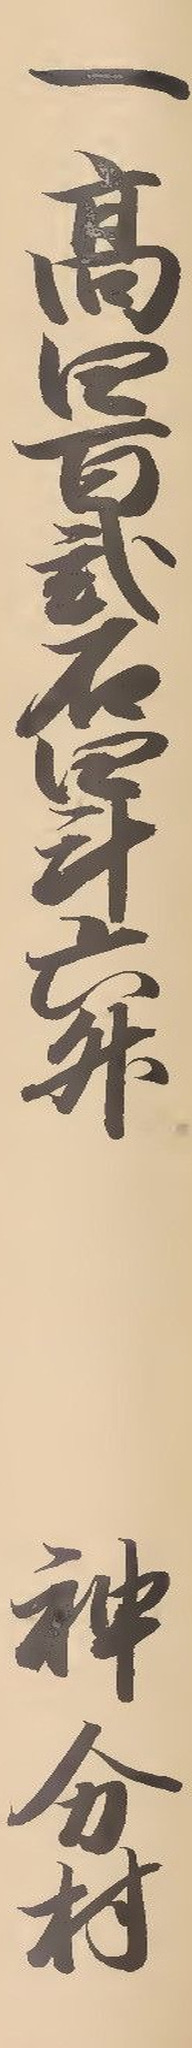一高四百弐石四斗六升神分村
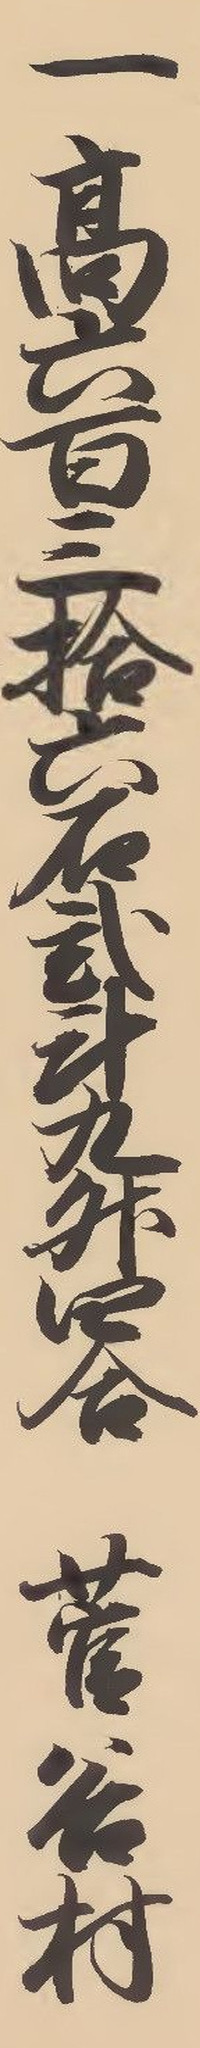一高六百三拾六石弐斗九升四合菅谷村
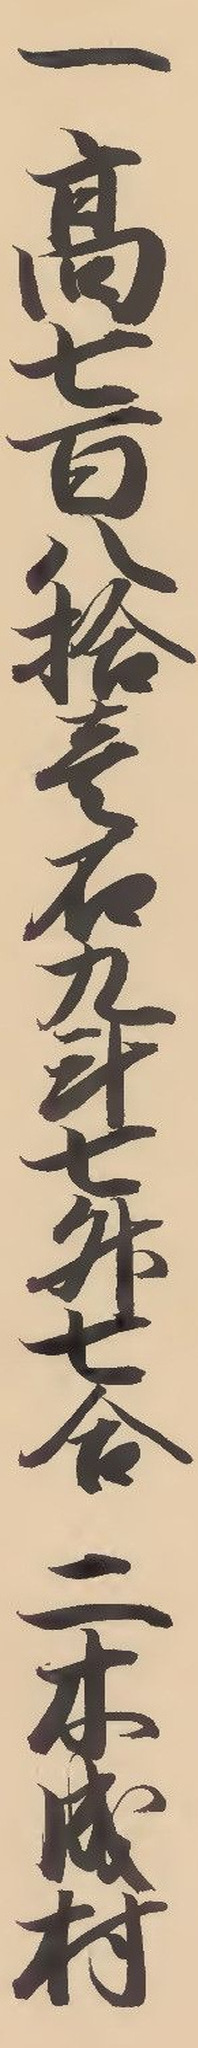一高七百八拾壱石九斗七升七合二木成村
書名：常陸国郷帳
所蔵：国立公文書館 National Archives of Japan
